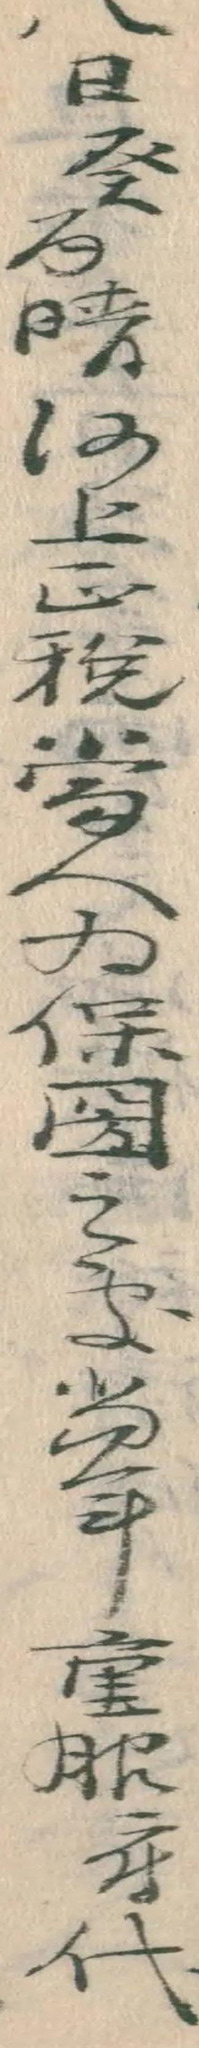八日癸酉晴河上正税当人為保圀之処当年重服ニ付代
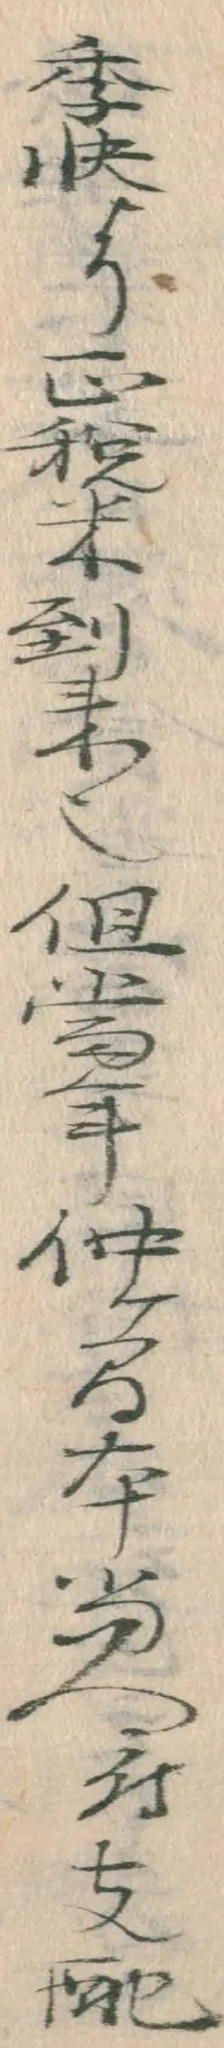季快より正税米到来也但当年仲ケ間本当人ニ付支配
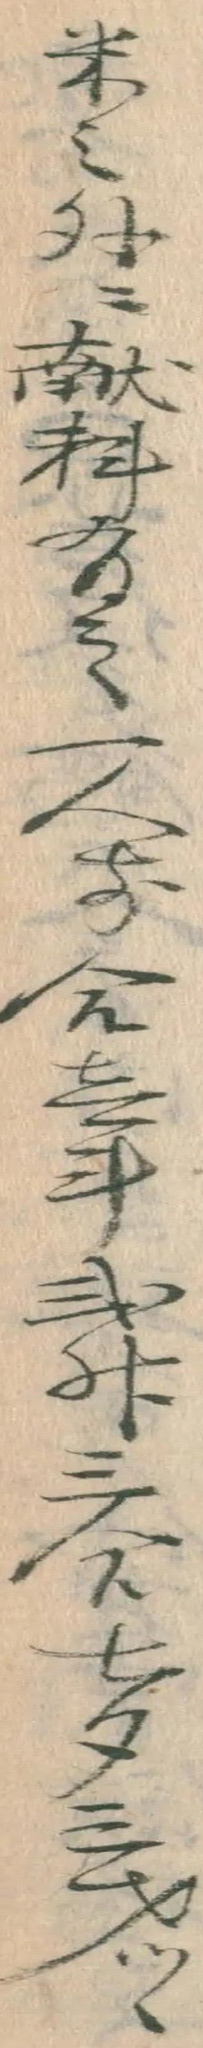米之外ニ献料有之一人前合壱斗弐升三合七勺三才ツヽ

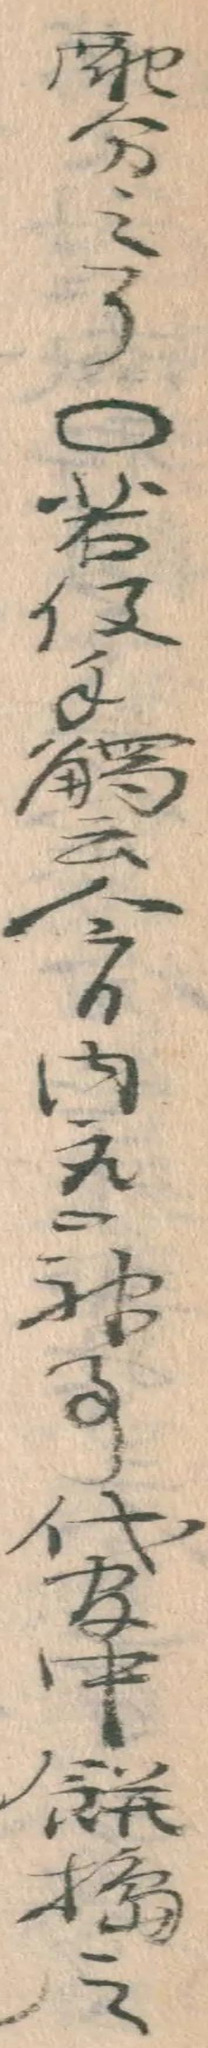配分之了○若役手觸云今日内取御神事代官中餅搗之
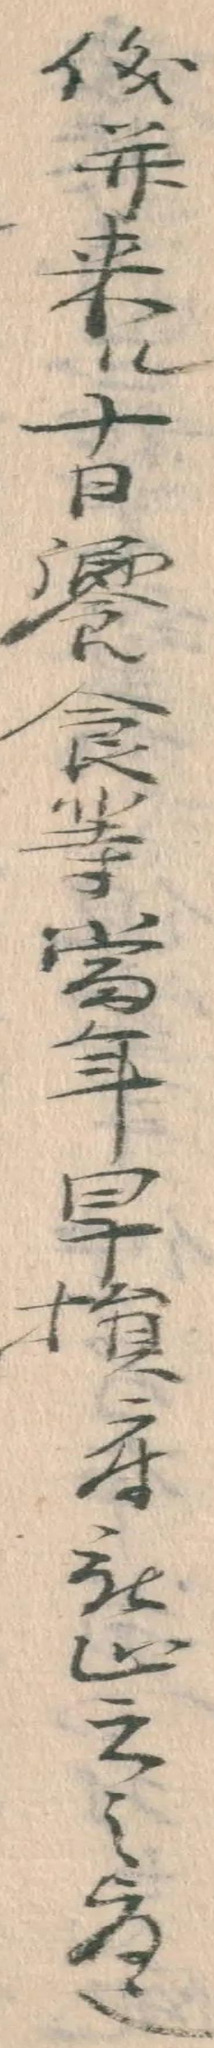儀并来ル十日饗食等当年旱損ニ被止之之旨也
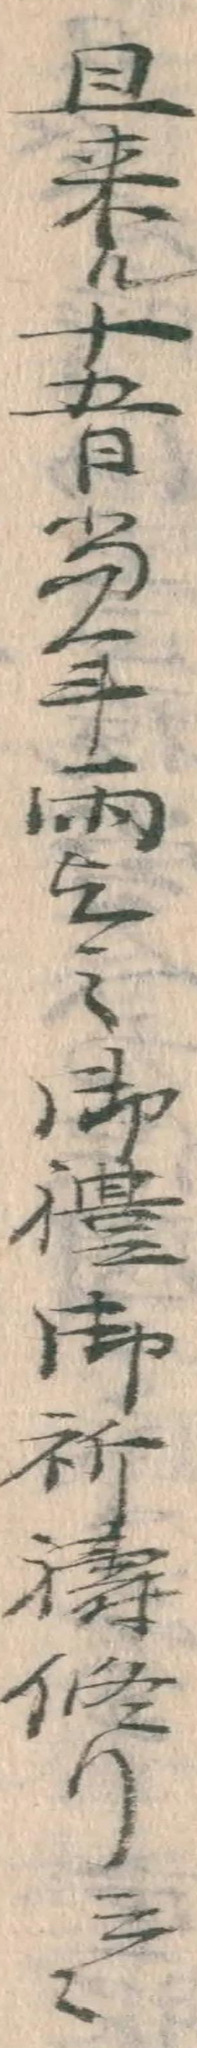且来ル十五日当年雨乞之御礼御祈祷修行云々
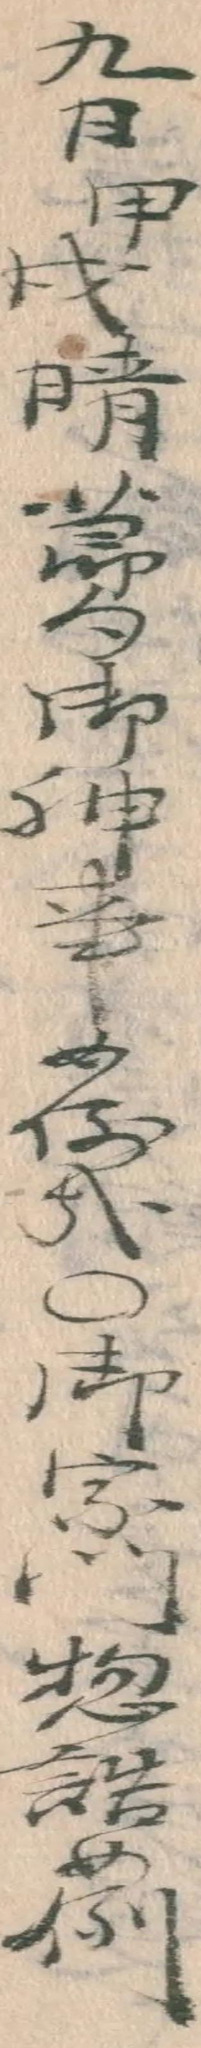九日甲戌晴節句御神事如例哉○御家門惣詰如例
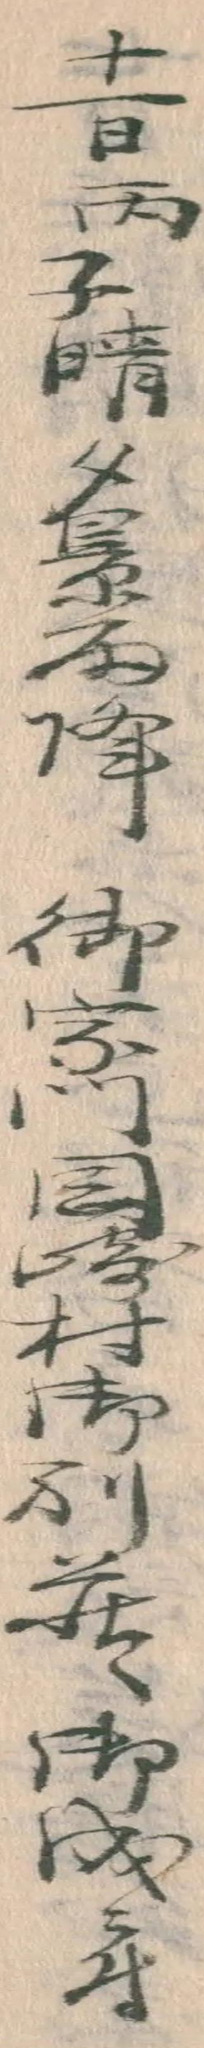十一日丙子晴夕景雨降御家門岡崎村御別荘へ御成ニ付
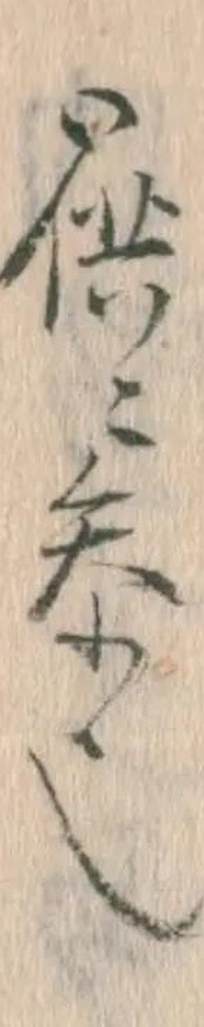御供ニ参也
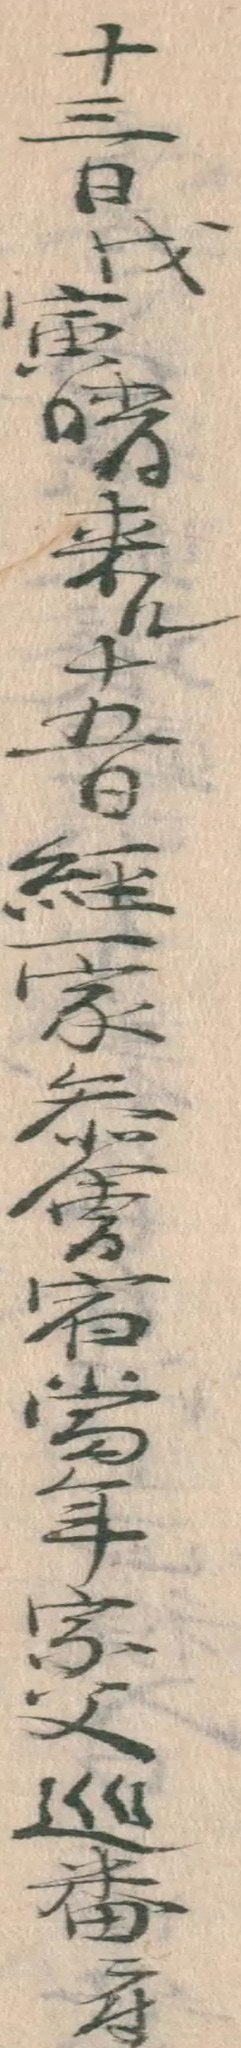十三日戊寅晴来ル十五日経一家参会宿当年家父巡番ニ付
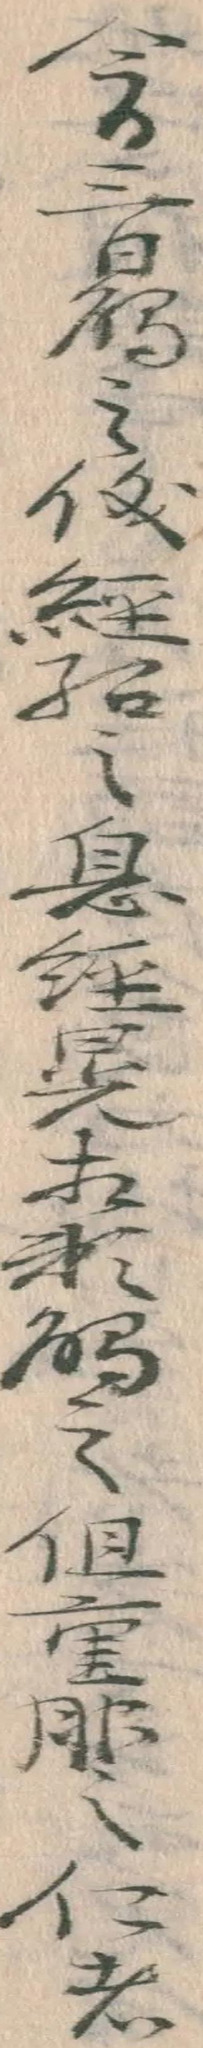今日三日觸之儀経紹之息経晃相頼觸之但重服之仁者
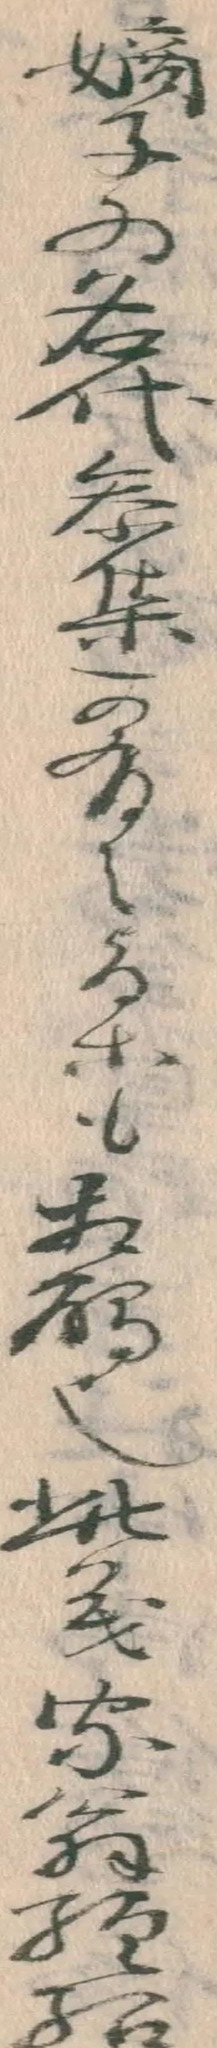嫡子為名代参集可有之旨等も相觸也此義家翁経紹
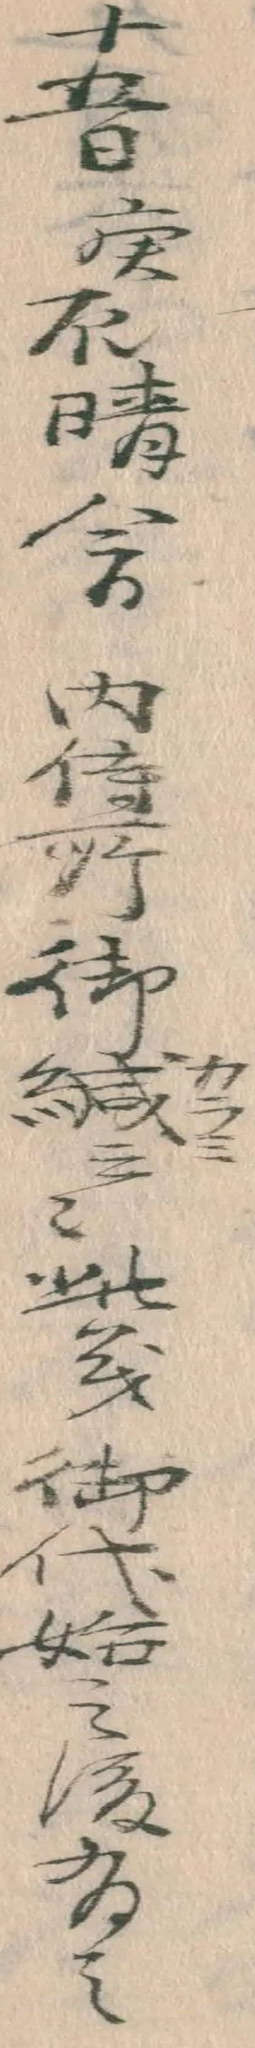十五日庚辰晴今日内侍所御緘云々此義御代始之後有之
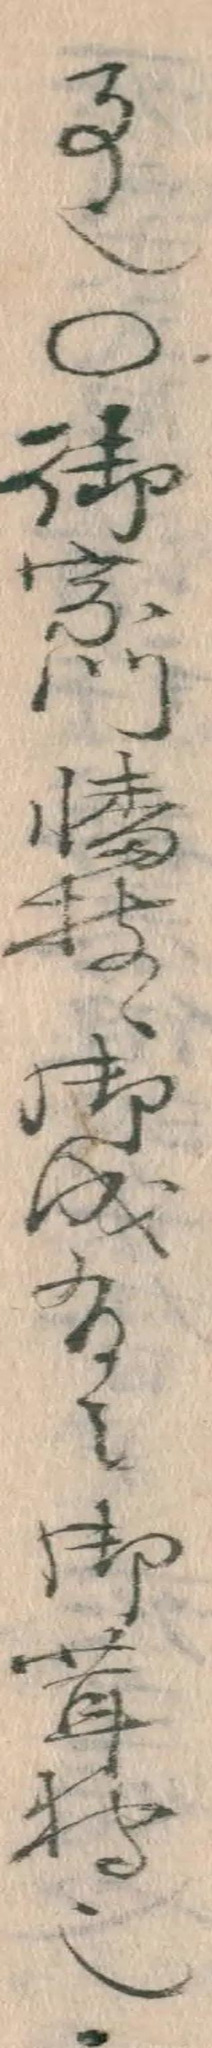事也○御家門幡枝へ御成有之御他家茸狩也
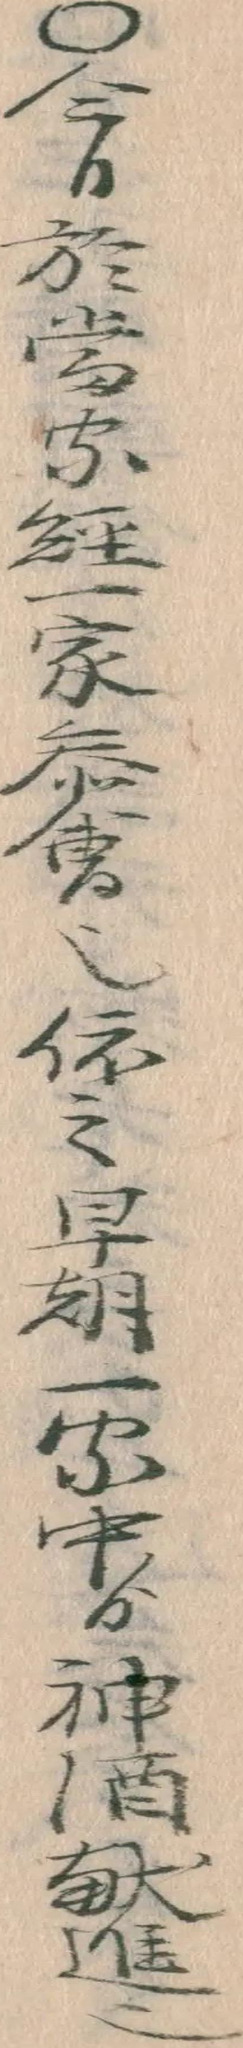○今日於当家経一家参会也依之早朝一家中ゟ神酒献進也
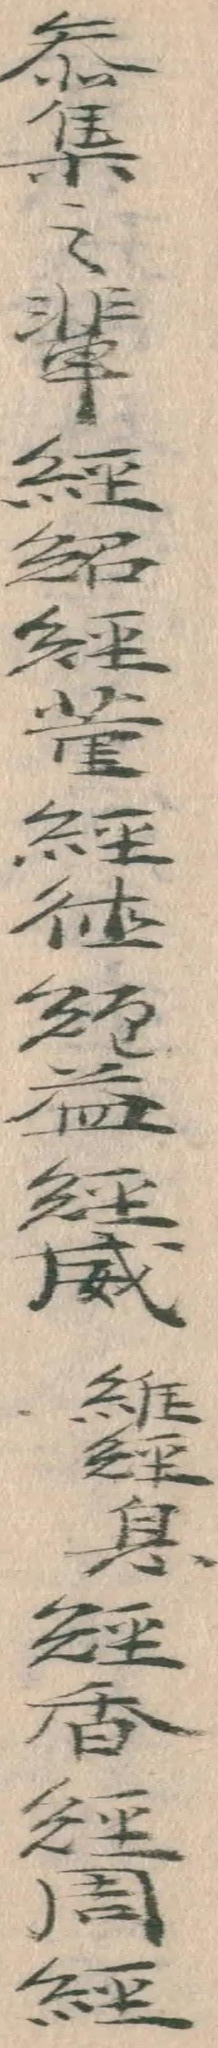参集之輩経紹経董経徳経益経威維経息経香経周経
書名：賀茂社記録. 第64冊
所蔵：国立国会図書館 National Diet Library, JAPAN
